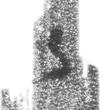之
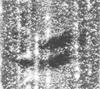㠯（以）
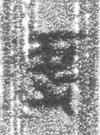卑
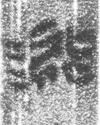○（亂）
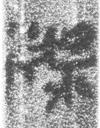○（世）
